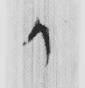人
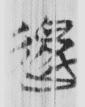退
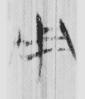用
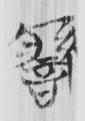䌛
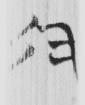今
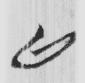㠯（以）
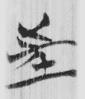㞷
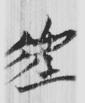𫊟
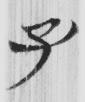子
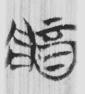𨟻
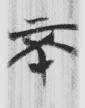不
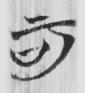可
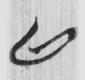㠯（以）
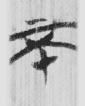不
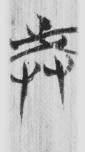戒
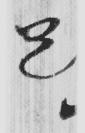巳
